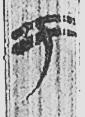于
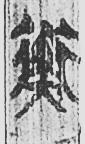衡
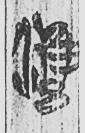澭
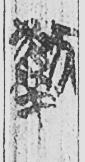獻
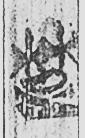楚
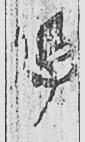俘
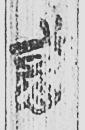馘
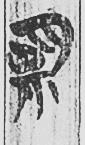{明示}
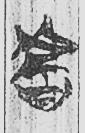者
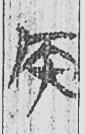侯
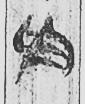於
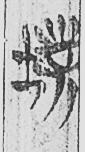{土丵川}
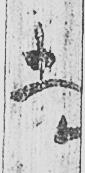土
